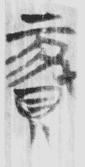賅
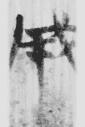成
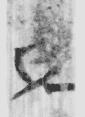𡚦
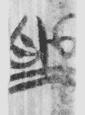爲
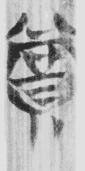賞
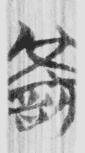罰
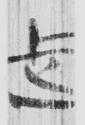上B
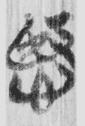{臣又心}
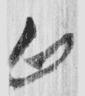㠯（以）
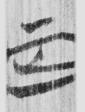正
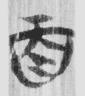百
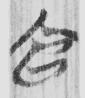官
